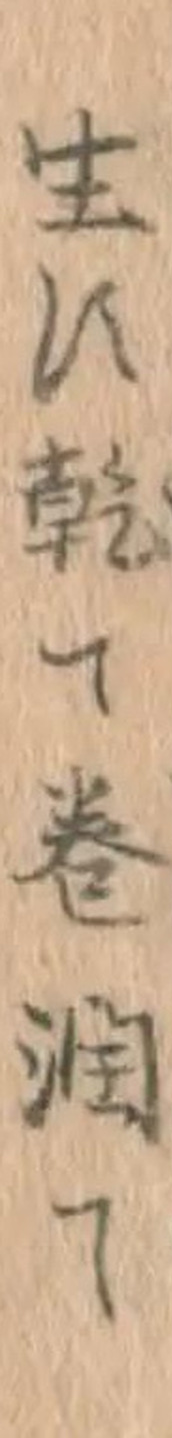生す乾て巻潤て
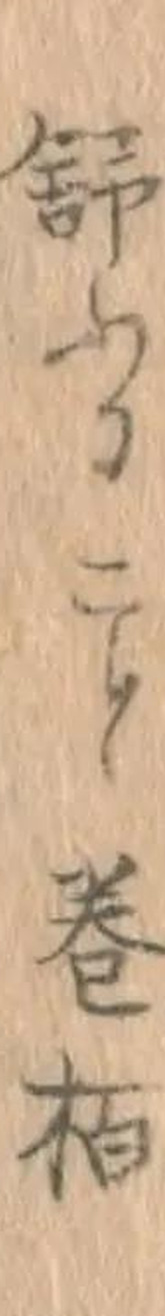舒ふること巻柏
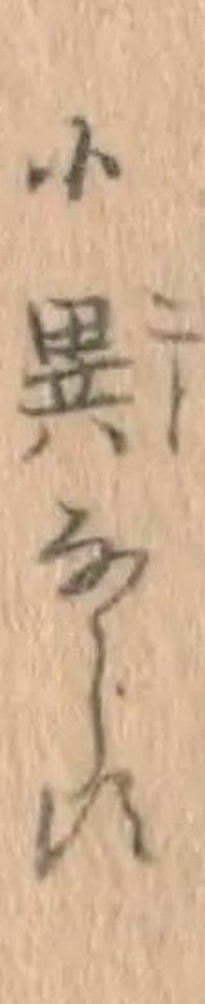に異ならす

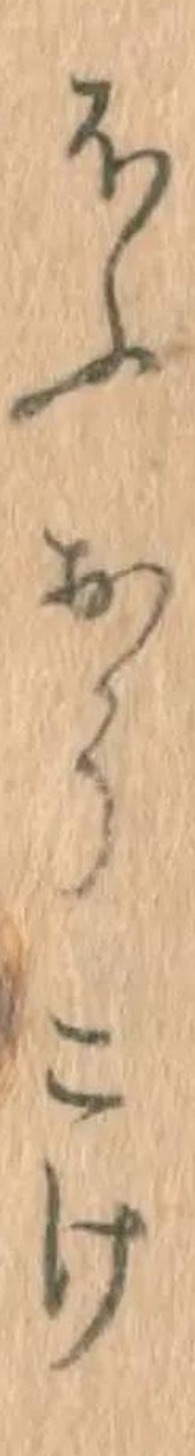ほふおうこけ
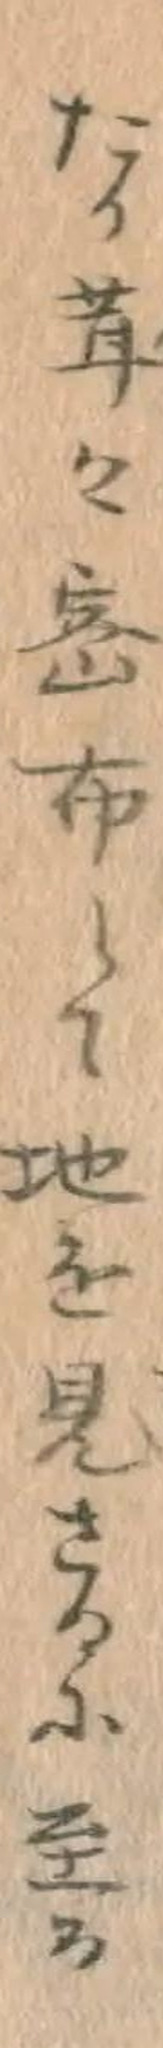たる茸々密布して地を見さるに至る
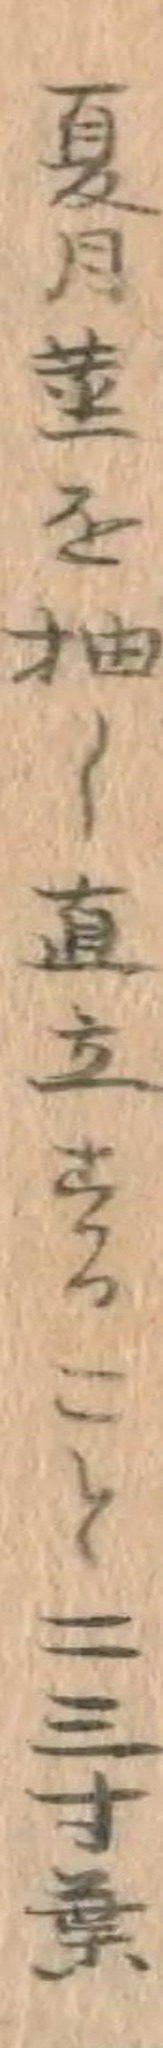夏月茎を抽し直立すること二三寸葉
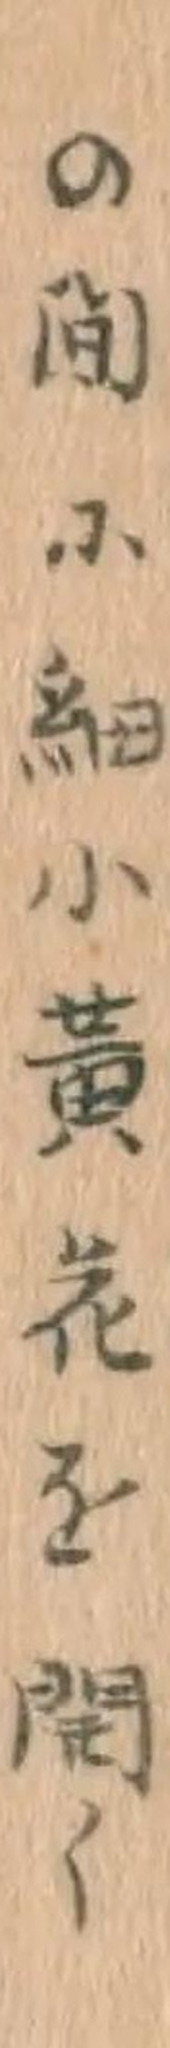の間に細小黄花を開く
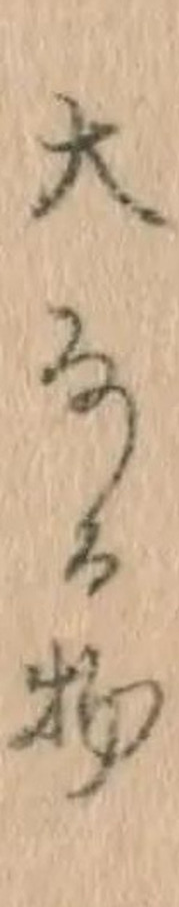大なる物
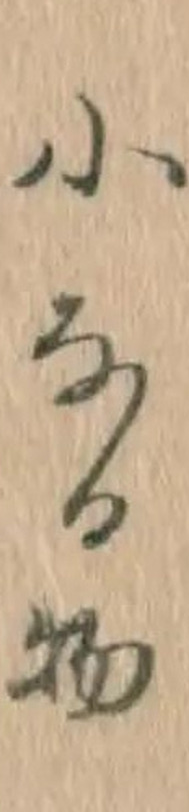小なる物

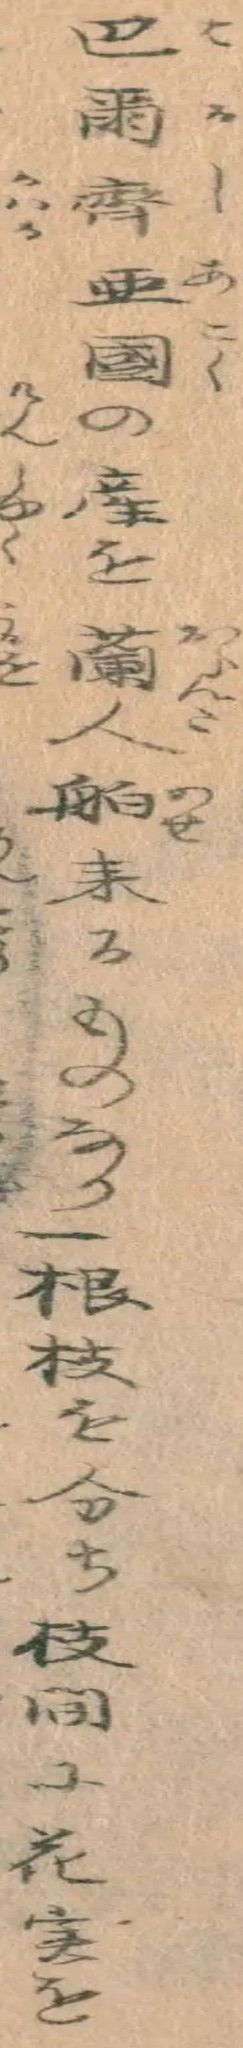巴爾斉亜国の産を蘭人舶来るものなり一根枝を分ち枝間に花実を
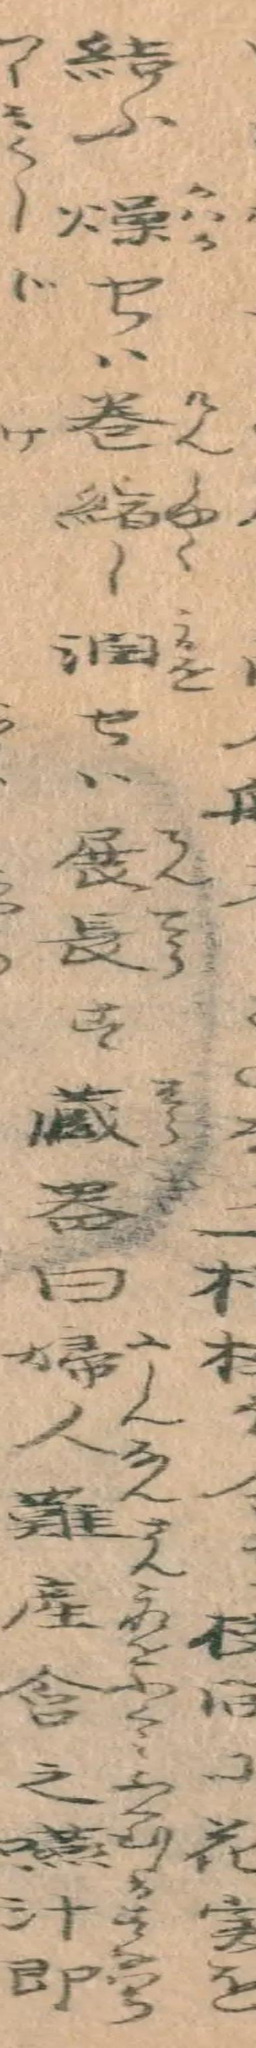結ふ燥せは巻縮し潤せは展長す蔵器曰婦人難産含之嚥汁即
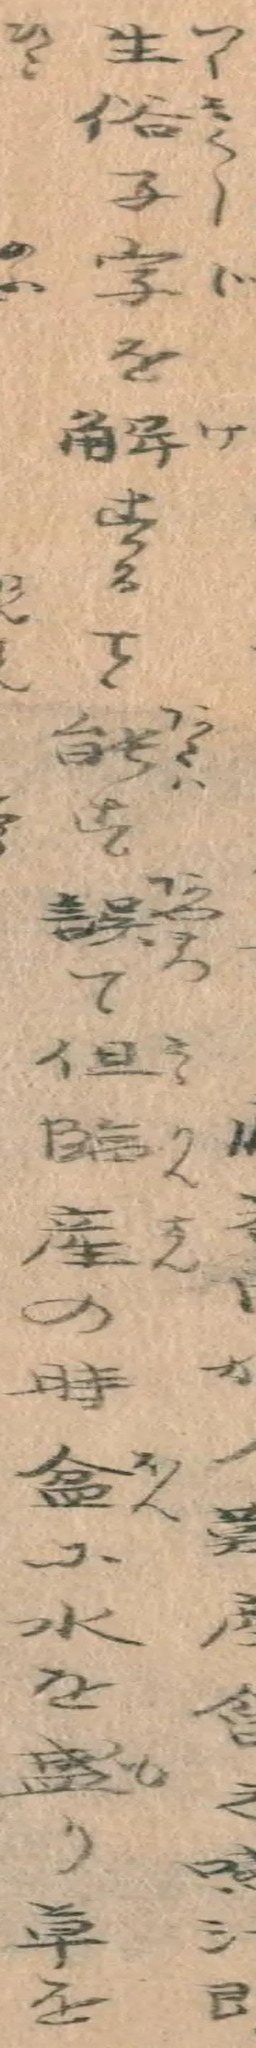生俗子字を解すること能す誤て但臨産の時盆に水を盛り草を
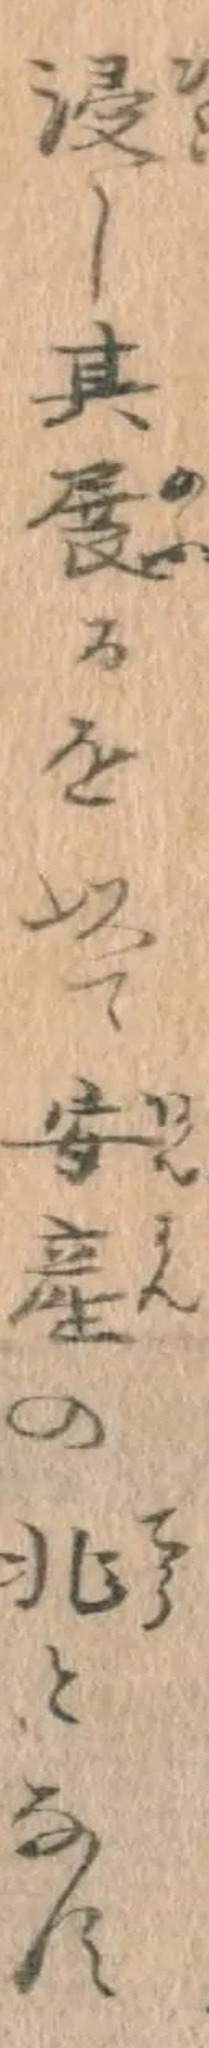浸し其展るを以て安産の兆となす

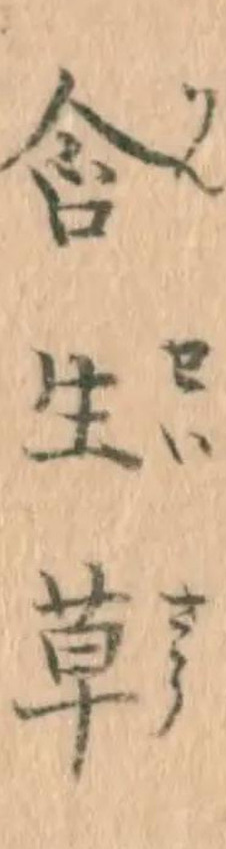含生草
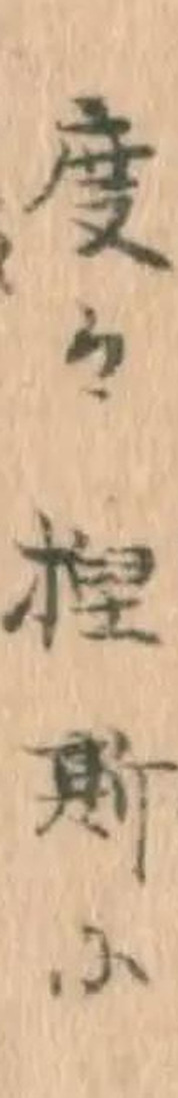度々捏斯に
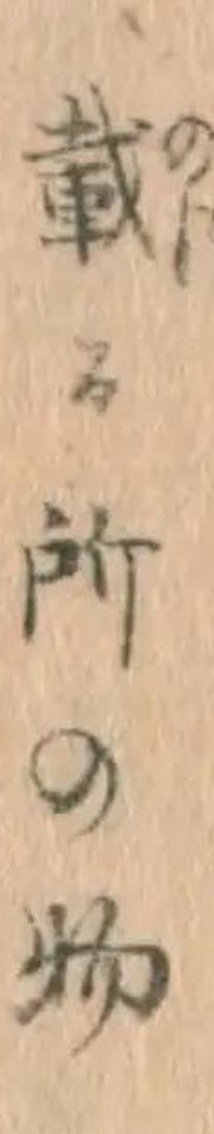載る所の物
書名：本草図譜. 巻37-39
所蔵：国立国会図書館 National Diet Library, JAPAN
